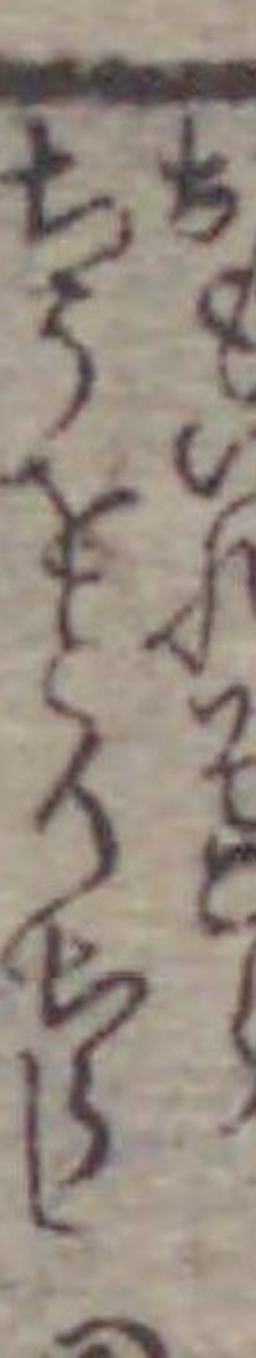ちうをとりちらし
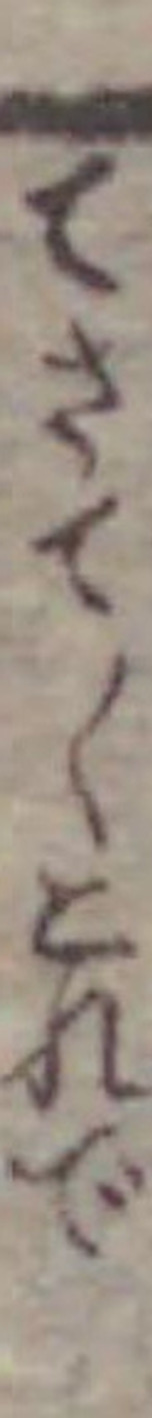てさて〳〵これで
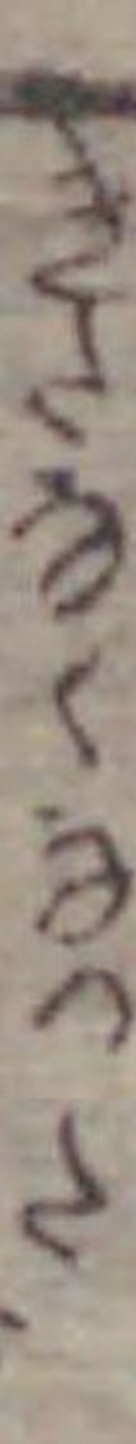きたなくなつた
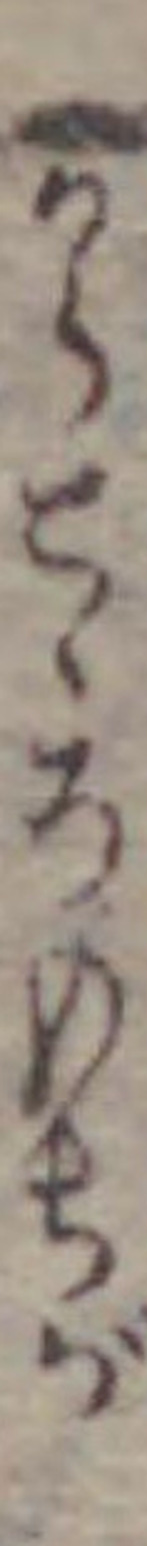からこゝろもちが
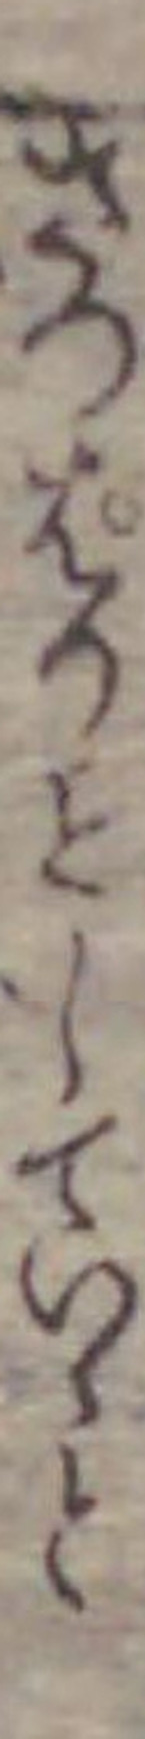さつぱりとしていゝと
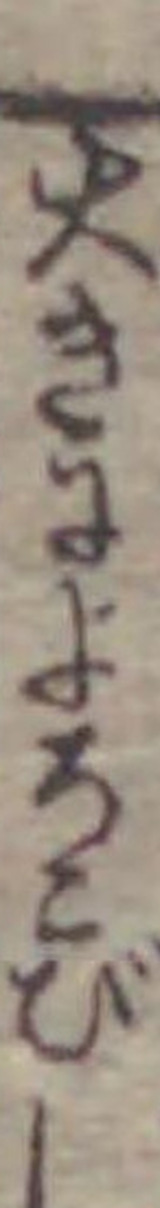大きによろこび
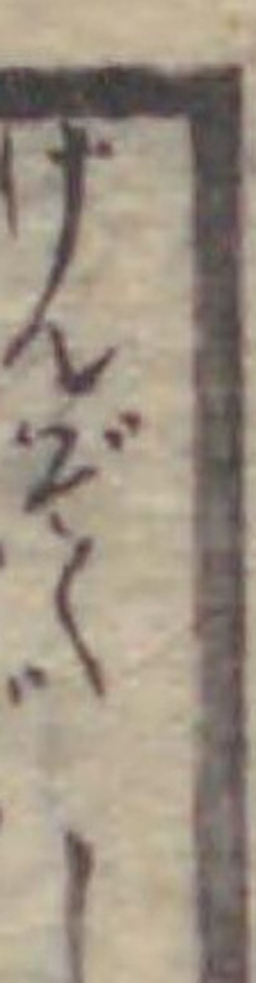けんぞく
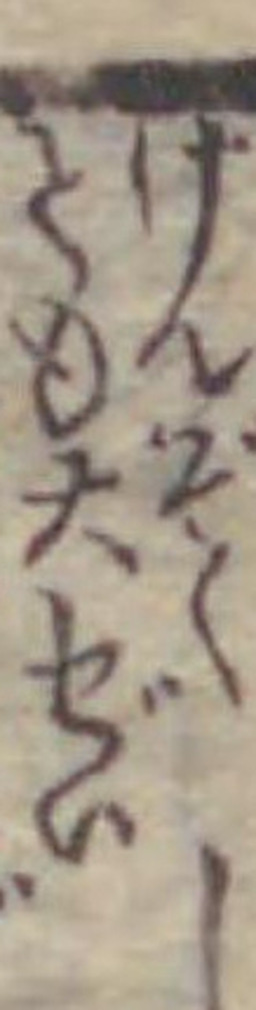とも大ぜい
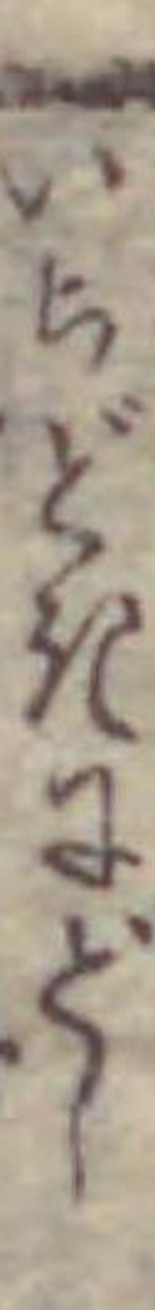いちどきにどし
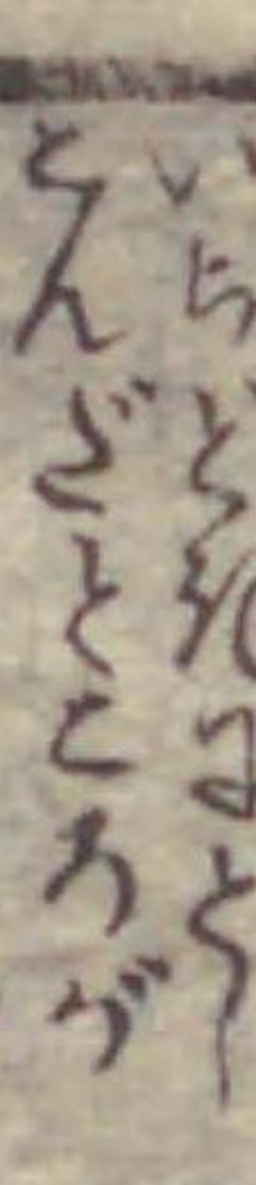こんだところが
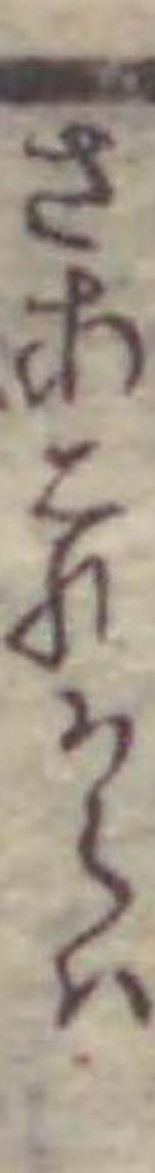さあこれからは
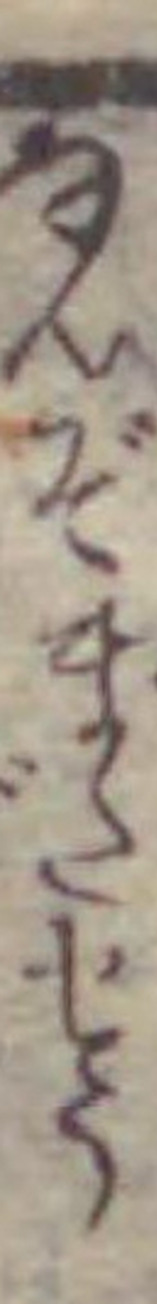なんぞまたせう
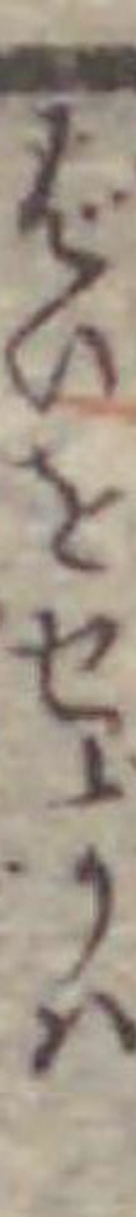ばいをせずは
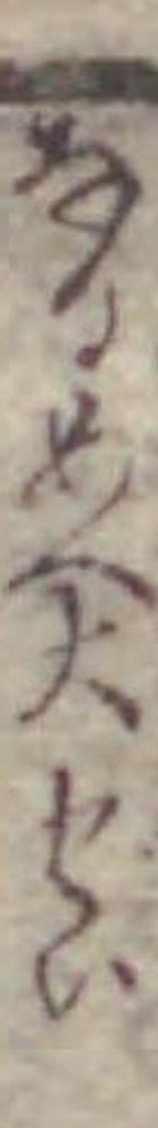なるめへ大ぜい
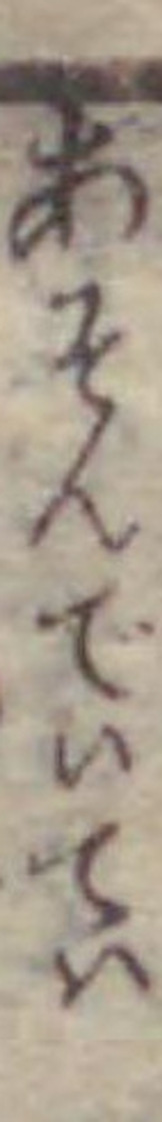あそんでいては
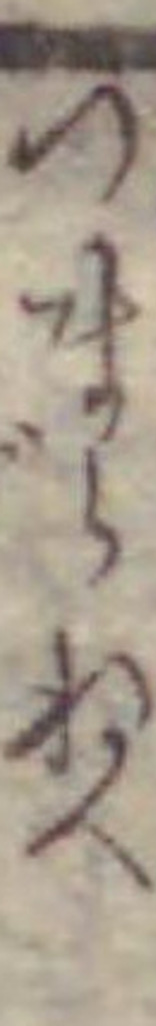つまらねへ
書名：化物見世開 : 2巻
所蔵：国立国会図書館 National Diet Library, JAPAN
